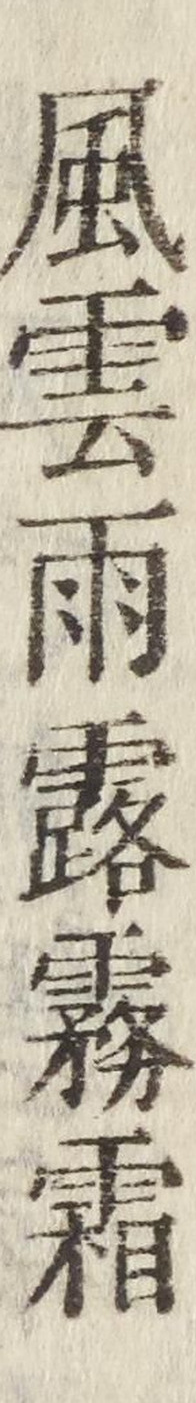風雲雨露霧霜
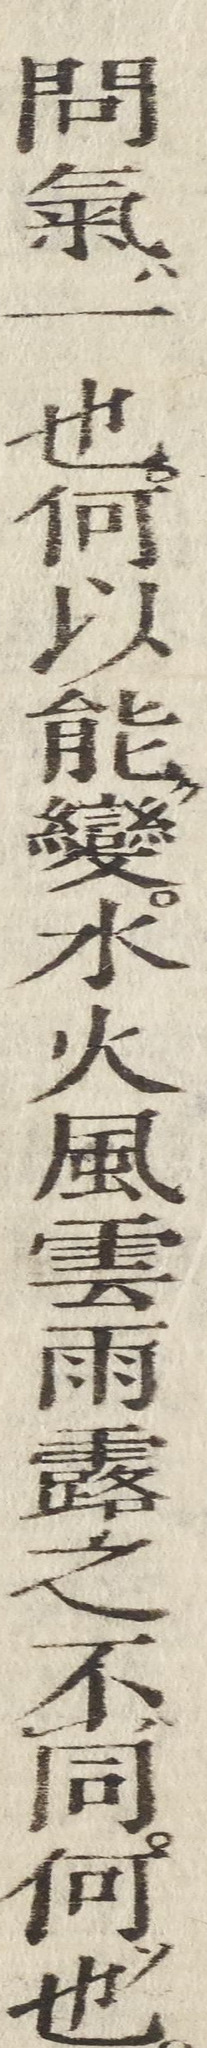問気一也。何以能変。水火風雲雨露之不同。何也。
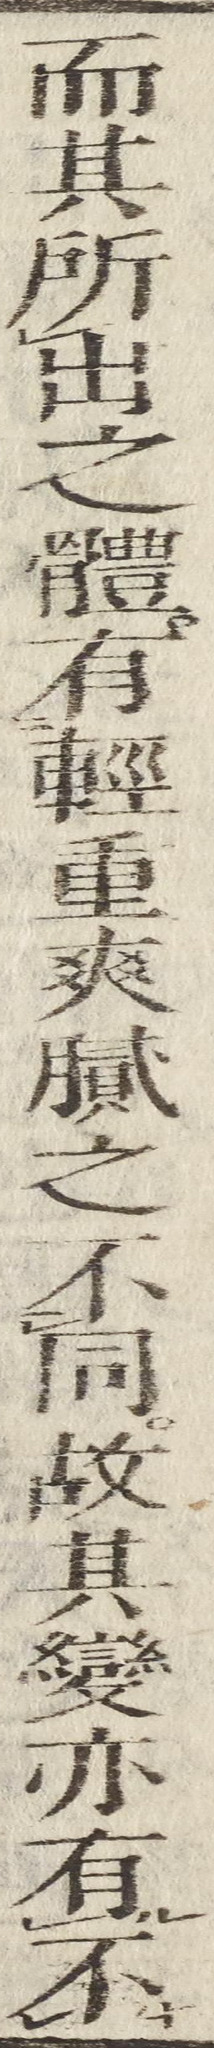而其所出之体。有軽重爽膩之不レ同。故其変亦有不
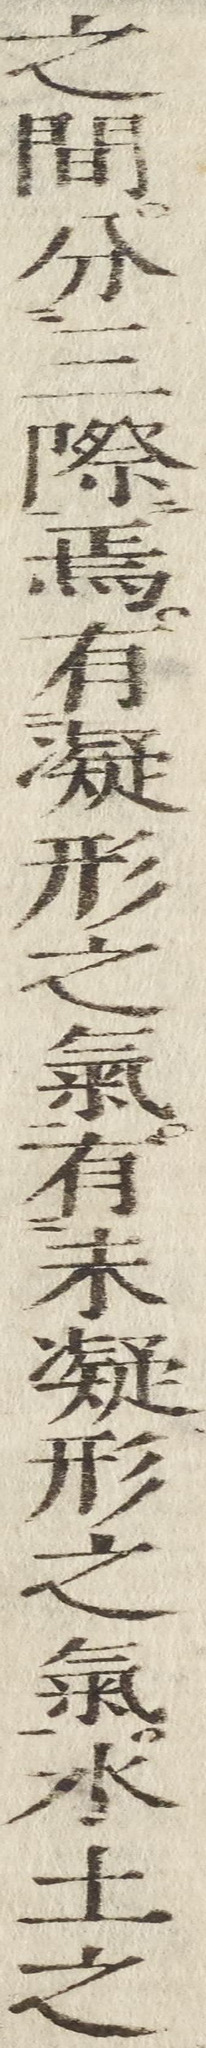之間。分三際二焉。有凝形之気。有未凝形之気。水土之

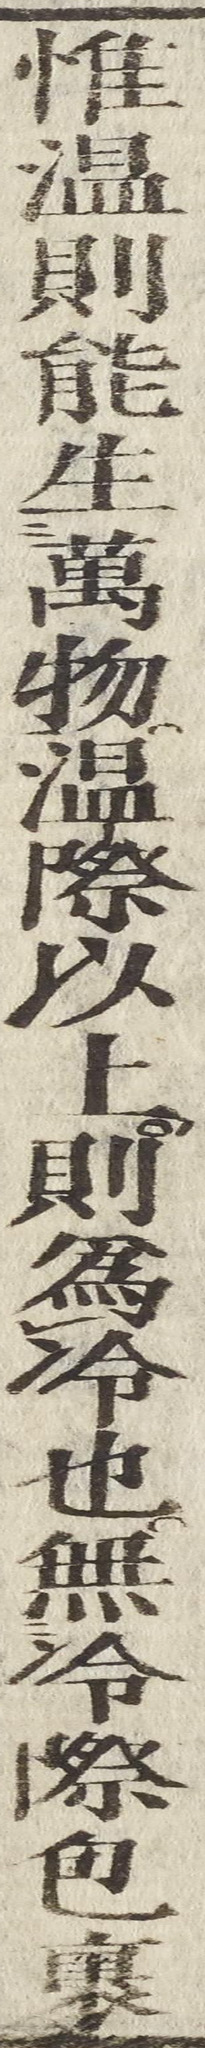惟温則能生万物。温-際以上。則為冷也。無冷際包褁
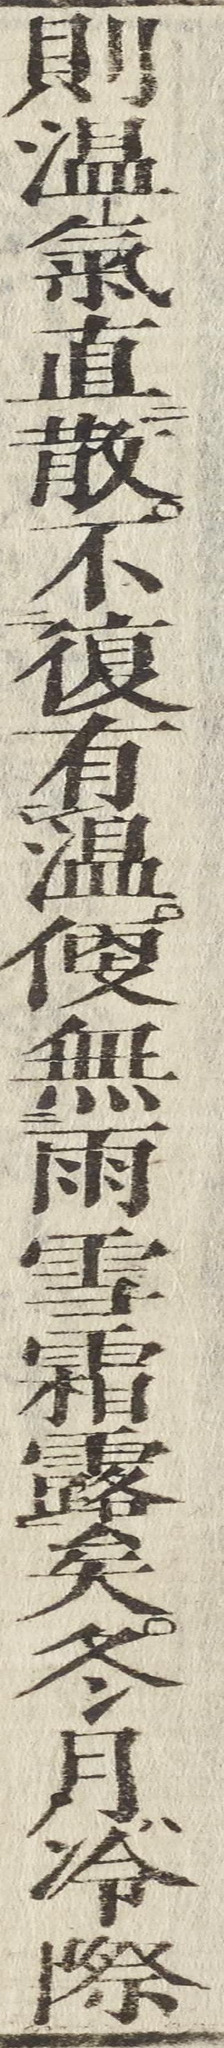則温-気直散。不復有レ温。便無雨雪霜露矣。冬月冷際
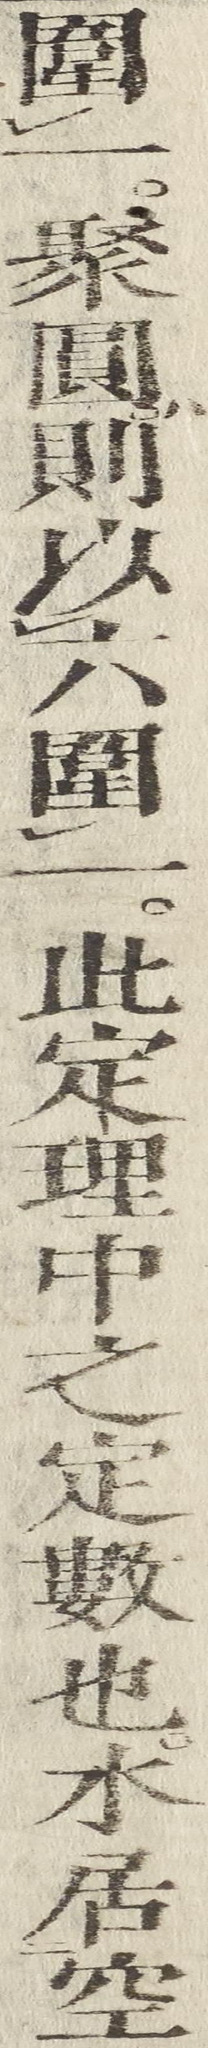囲一。聚円。則以六囲一。此定-理中之定数也。水居空

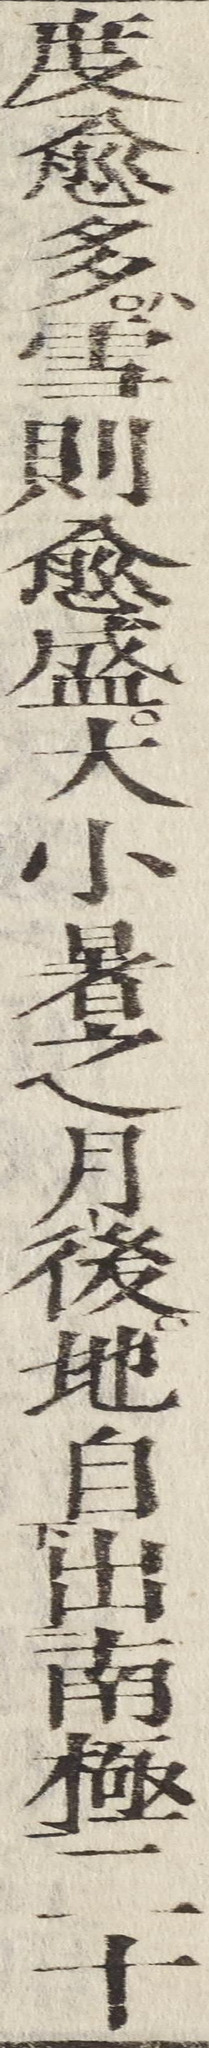度愈多。雪則愈盛。大小暑之月-後。地自出南極二十
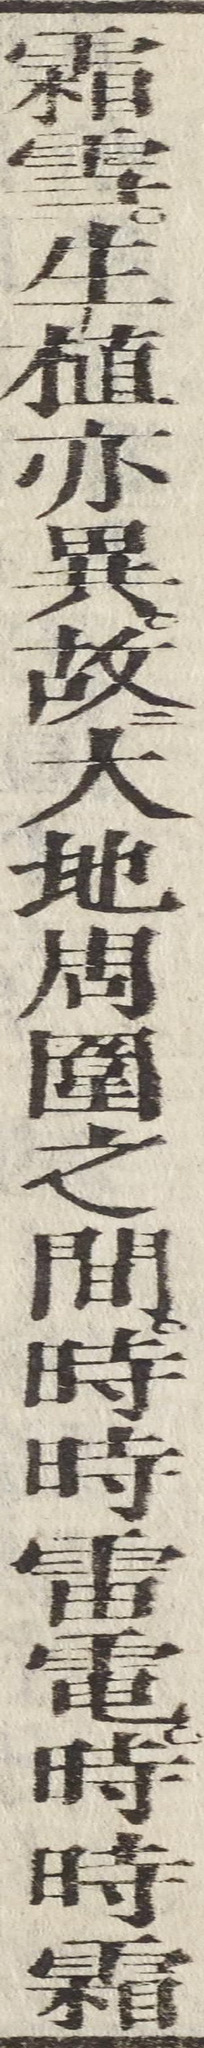霜雪。生-植亦異。故二大地周囲之間。時時雷電。時時霜
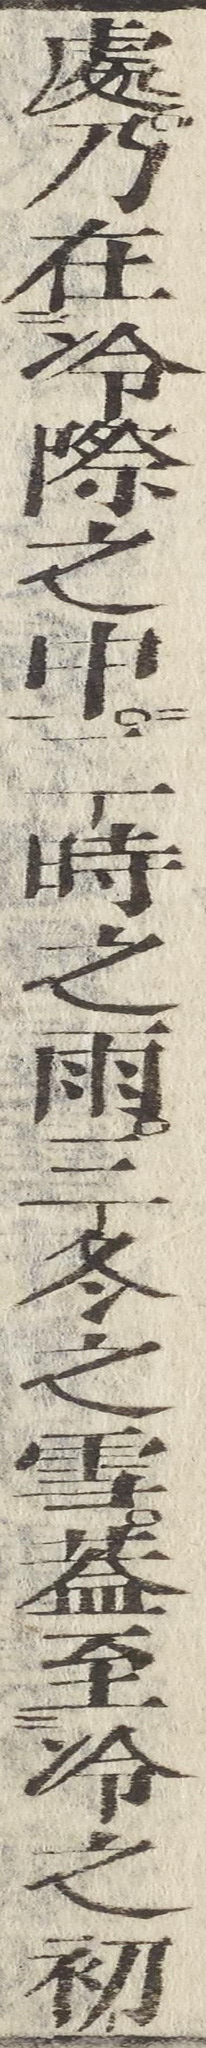処。乃在冷際之中二。二-時之雨。三-冬之雪。蓋至冷之初-

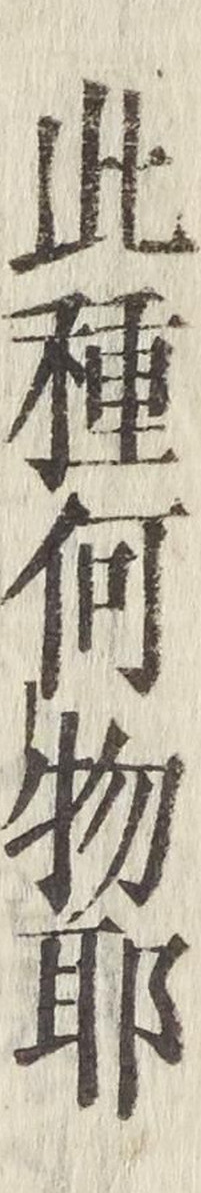此種何－物耶
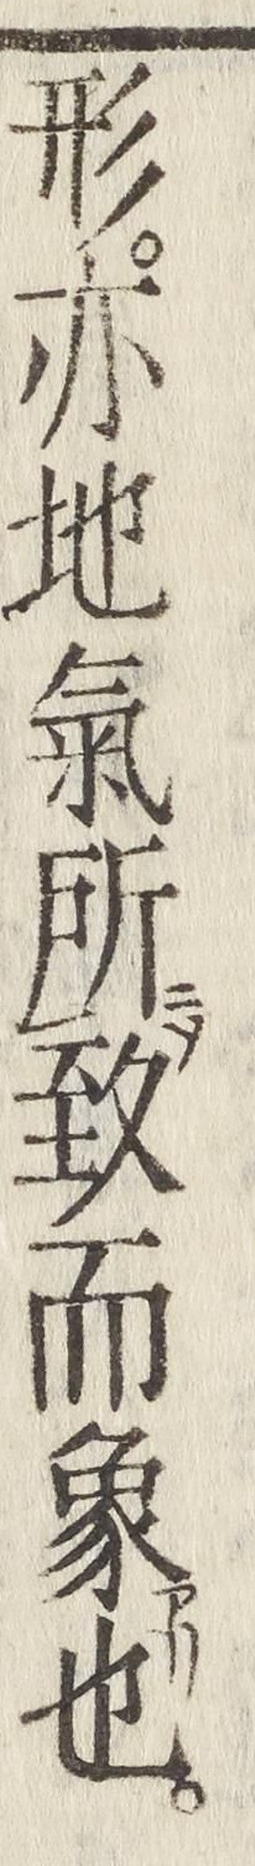形。亦地気所致而象也。

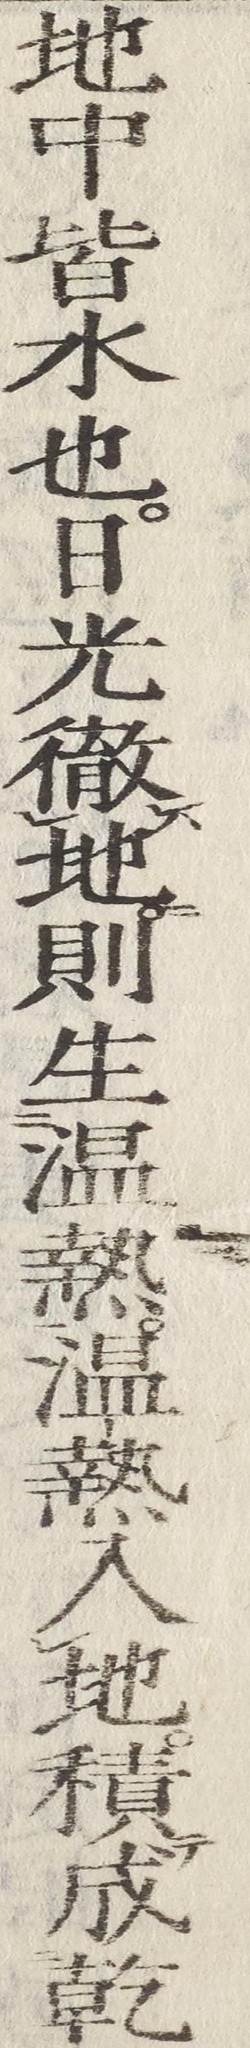地中皆水也。日光徹地二。則生温熱。温-熱入地。積成乾

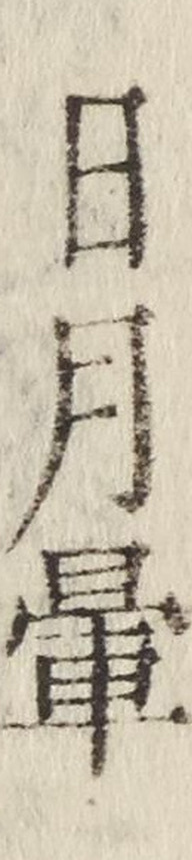日月暈
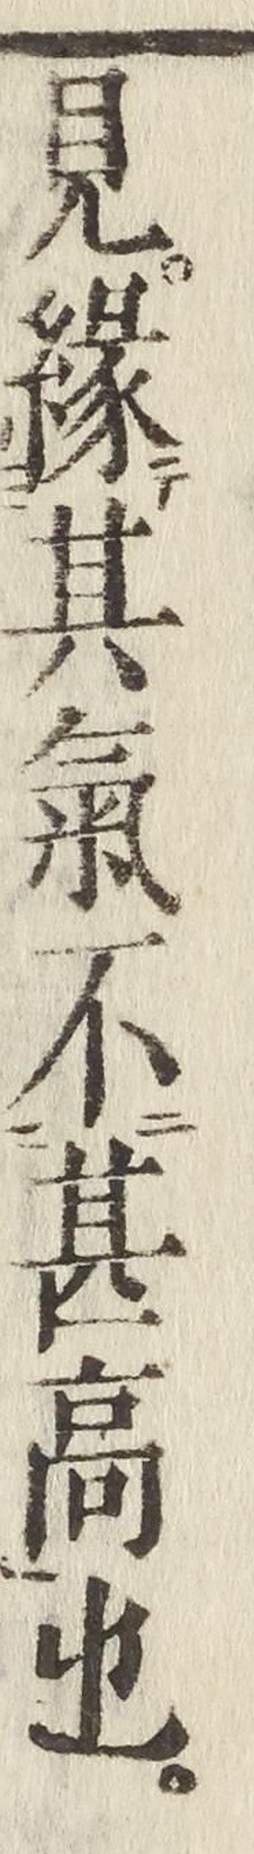見。縁其気不二甚高也。
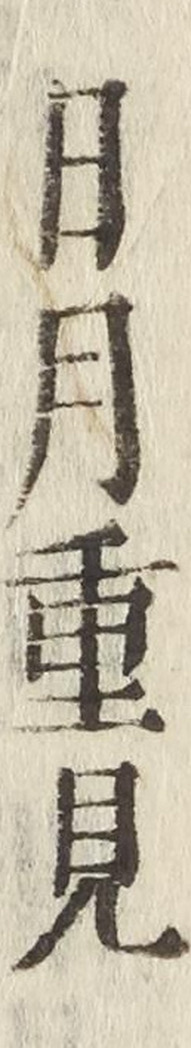日月重見
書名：天經或問　地
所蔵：東京大学地震研究所図書室 Earthquake Research Institute Library, The University of Tokyo, JAPAN
